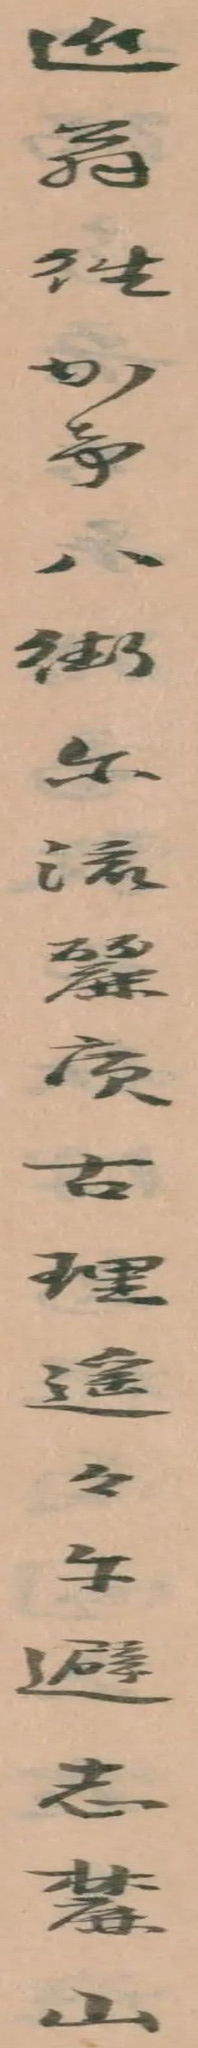近翁往か希八街尓流麗広古理遥々尓避志麓山
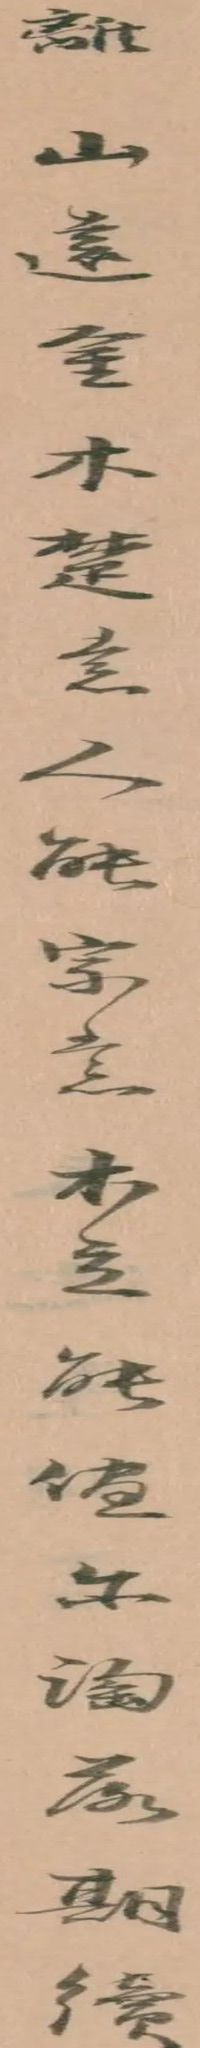離山遠金木楚裳人能家裳木立能儘尓淘落期続
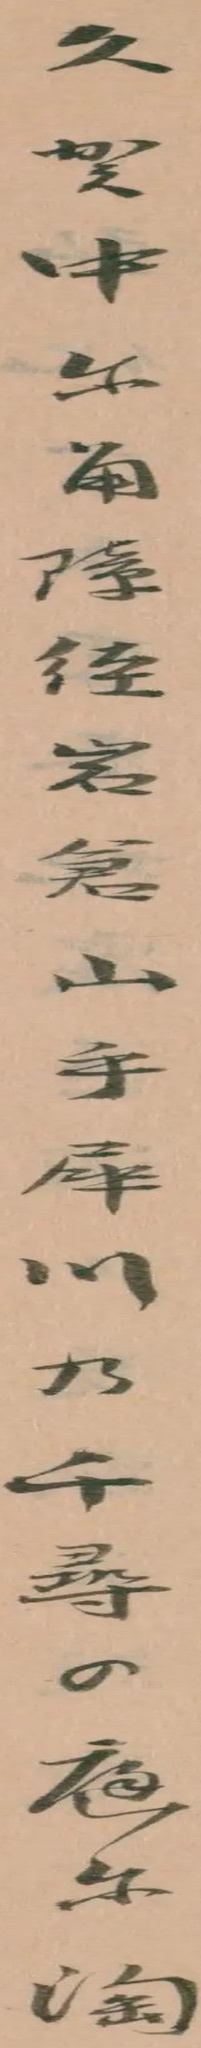久賀中尓角障径岩倉山乎犀川乃千尋の庭尓淘
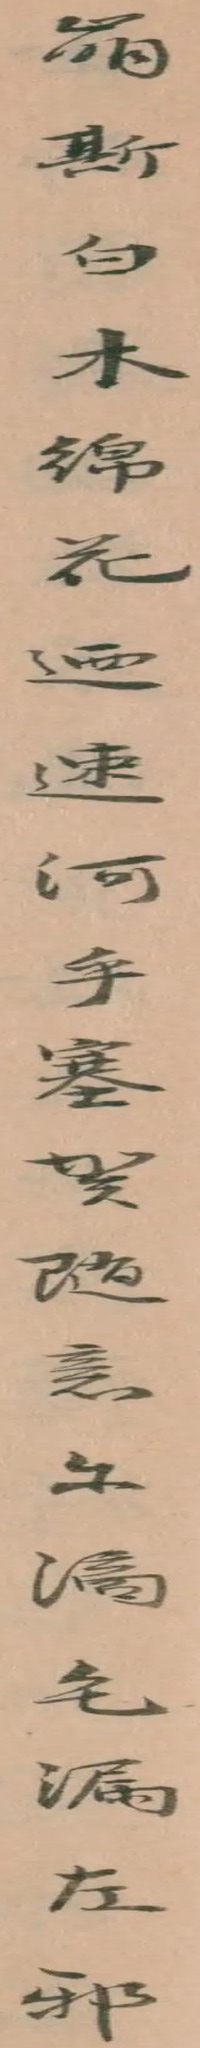崩斯白木綿花迺速河乎塞賀随意尓滴毛漏左邪
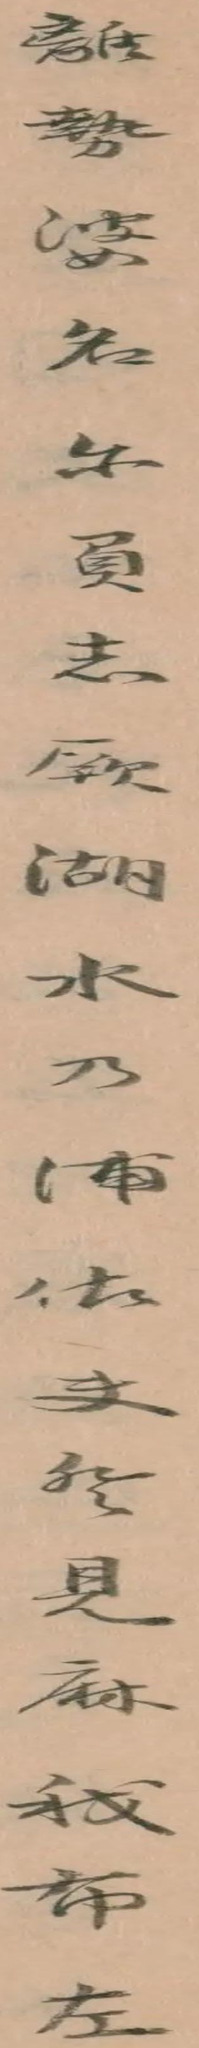離勢婆名尓負志厥湖水乃浦佐夫登見麻我布左
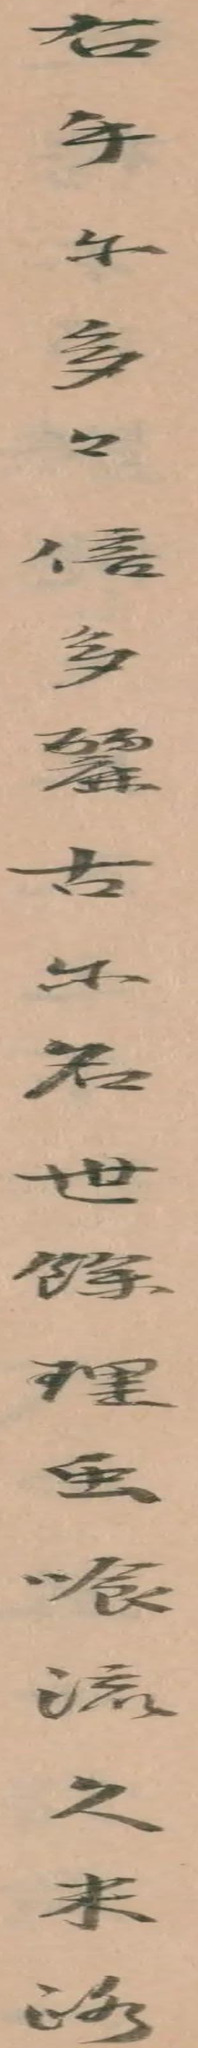右手尓多々倍多麗古尓名世余理虫喰流久米路
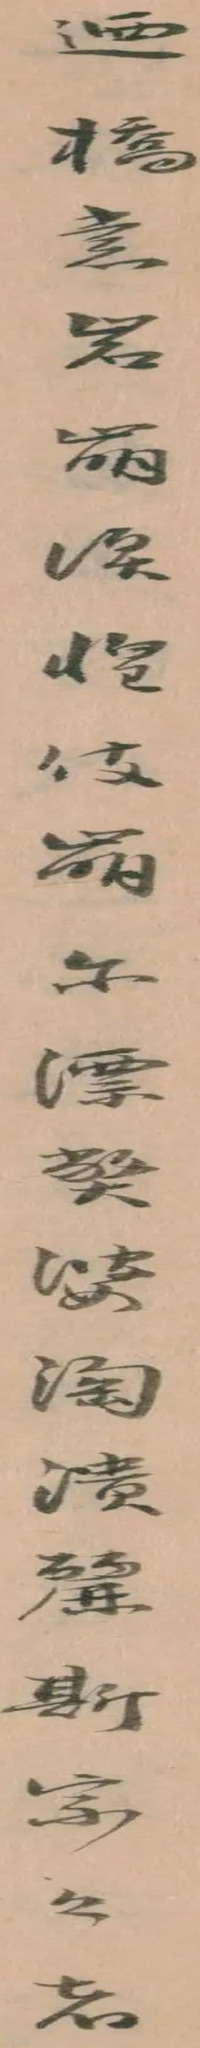迺橋裳岩崩惶伎崩尓漂弊婆淘潰麗斯家々者
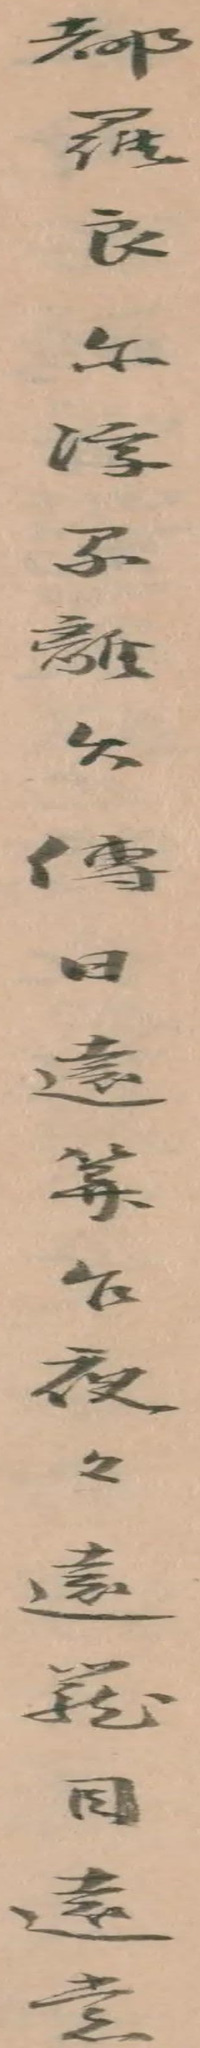都羅良尓浮累離云？伝日遠算乍夜々遠籠目遠裳
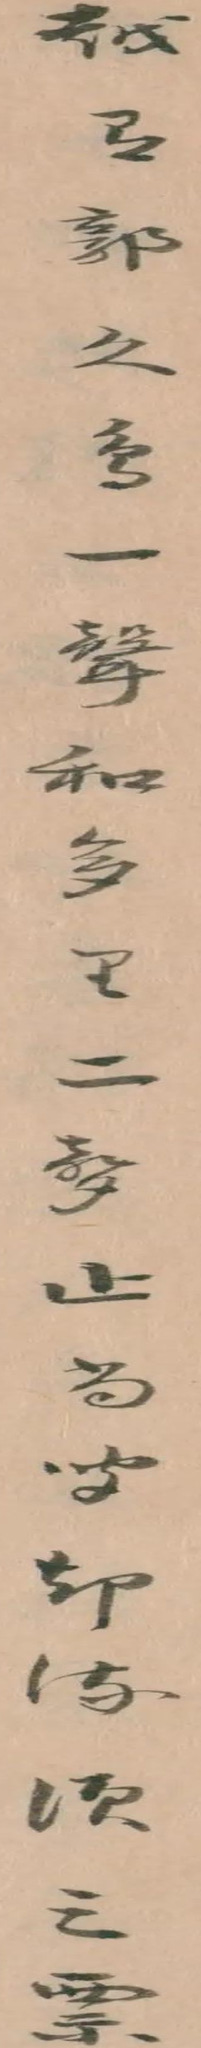越有郭久鳥一声和多里二声止当聞却流須三票
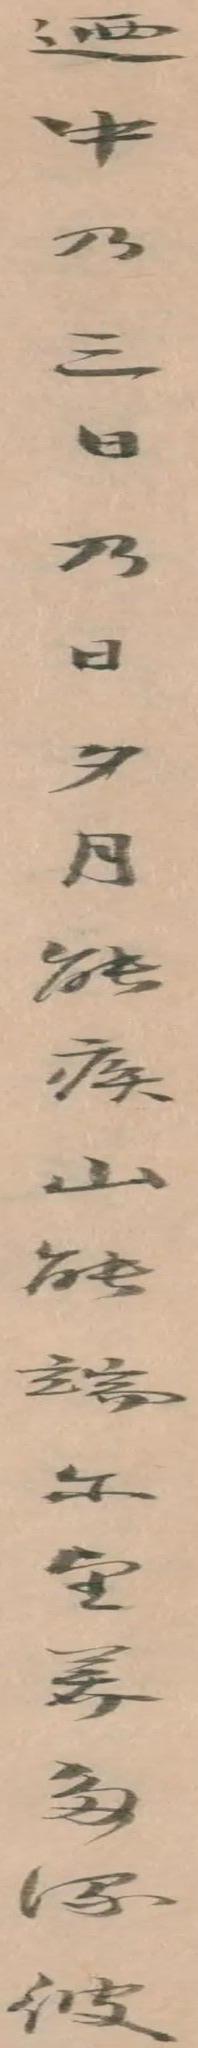迺中乃三日乃日夕月能疾山能端尓望美多流彼
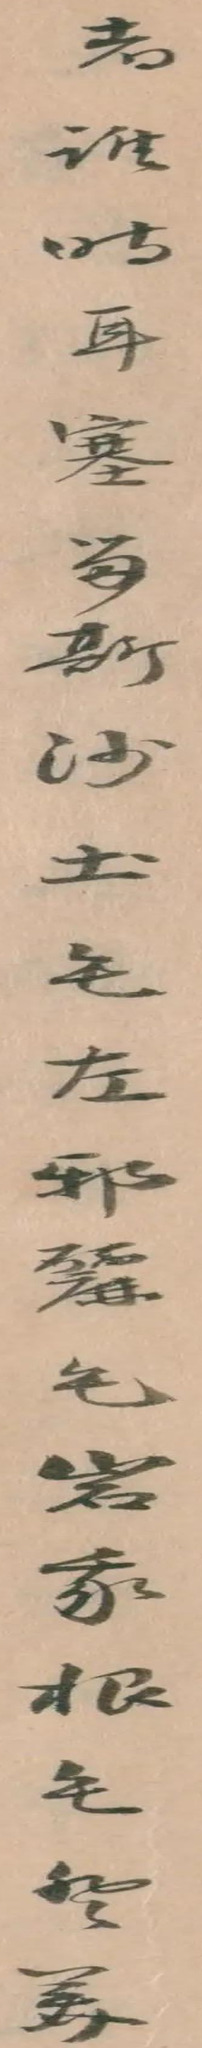者誰時耳塞留斯沙土毛左邪麗毛岩我根毛登美
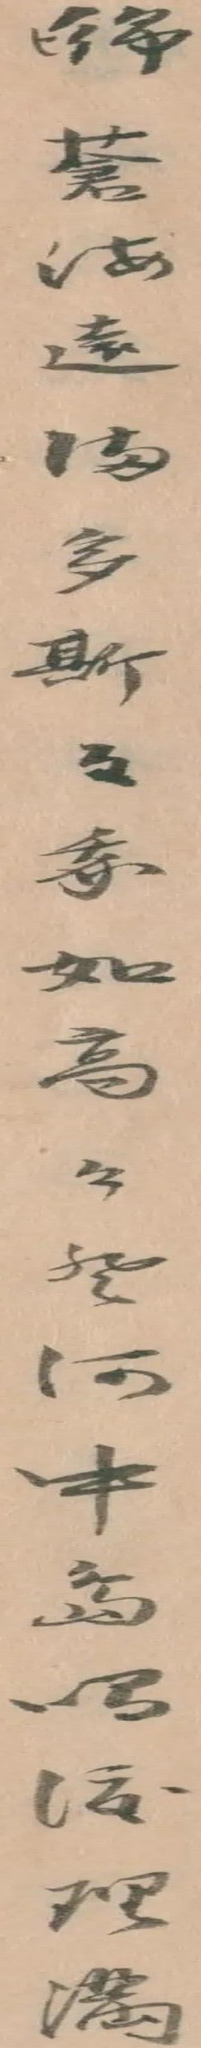帰蒼海遠満多斯る我如高々登河中島鳴渡理満

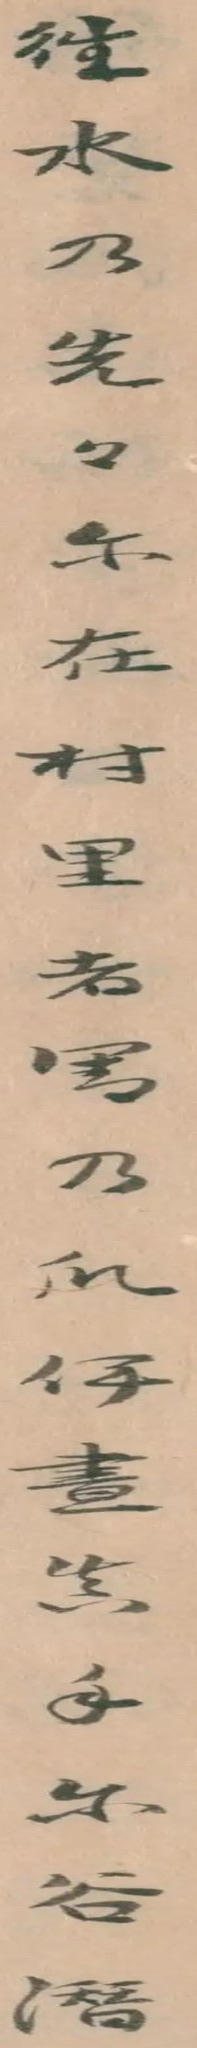往水乃先々尓在村里者乃爪伊昼真手尓谷潜
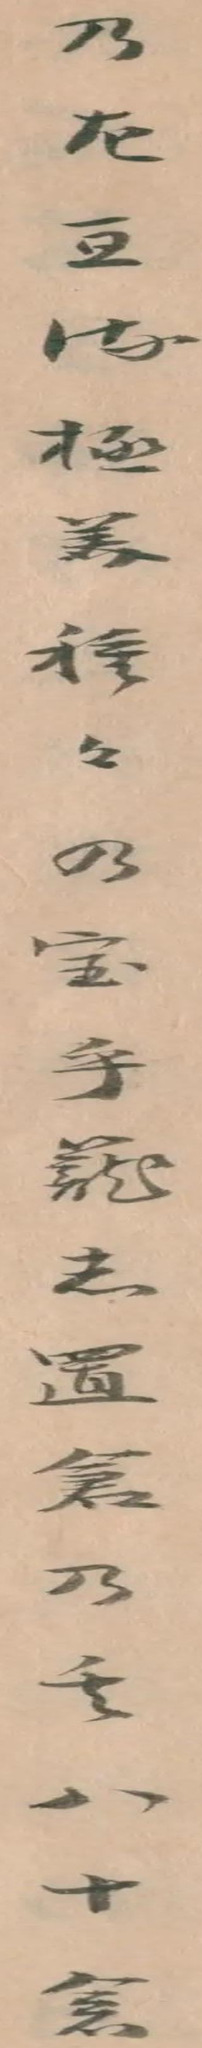乃左豆流極美種々乃宝乎駕籠志置倉乃其八十倉
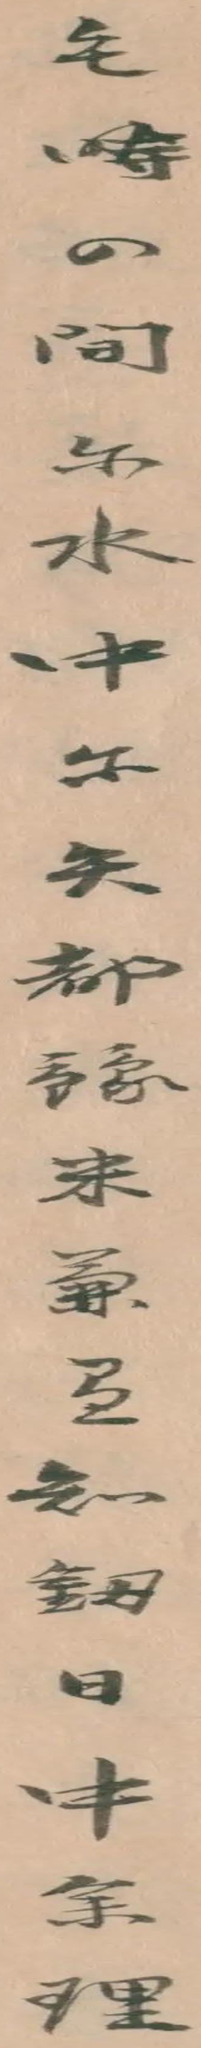毛時の間尓水中尓失都予米兼弖知釼日中余理
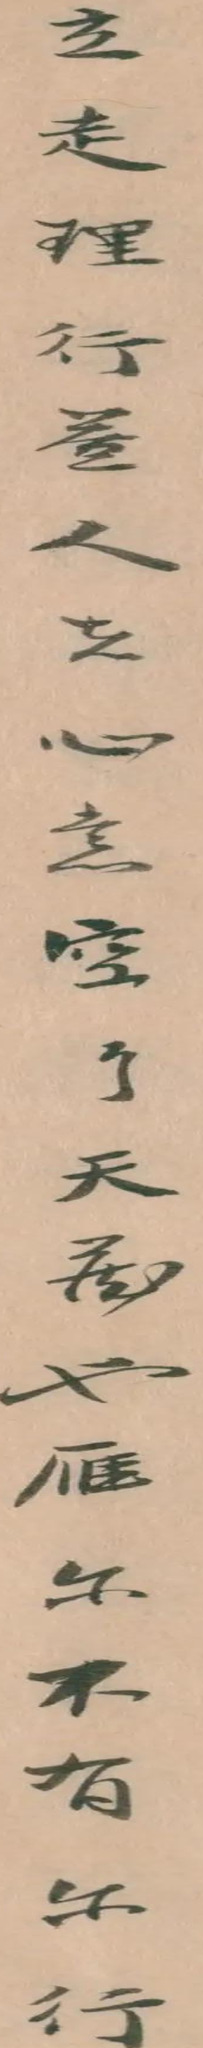立走理行益人者心裳空耳天蔵や雁尓不有尓行
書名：地災撮要. 巻5-6(地震之部)
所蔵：国立国会図書館 National Diet Library, JAPAN
